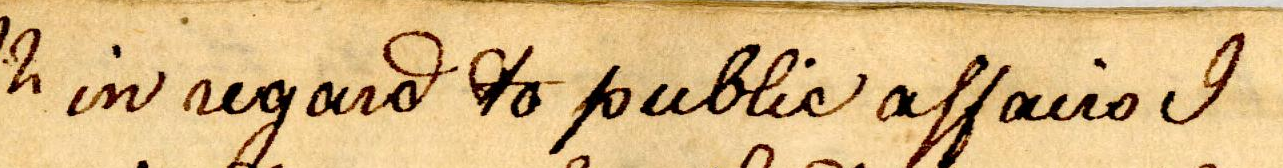in regard to public affairs I
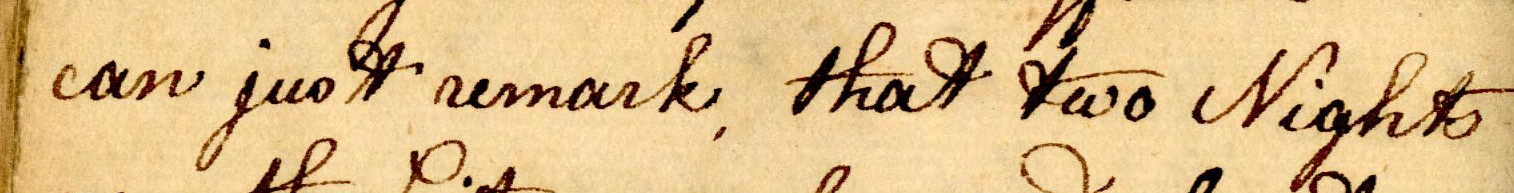can just remark, that two Nights
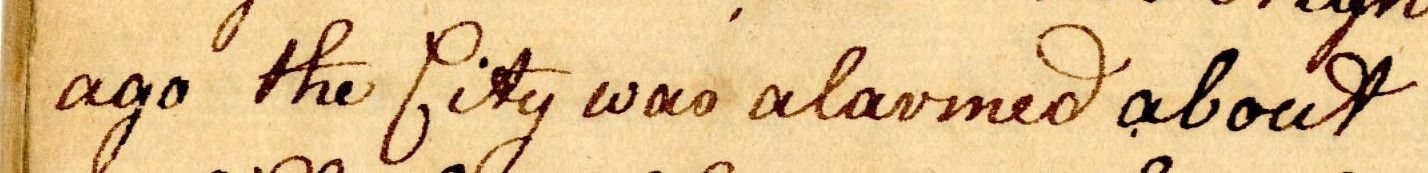ago the City was alarmed about
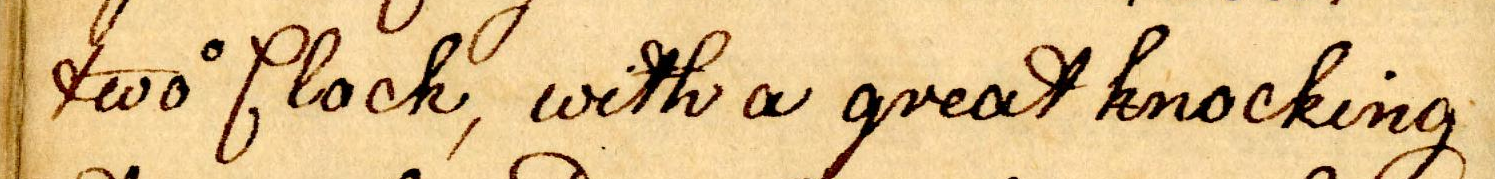two ^oClock, with a great knocking
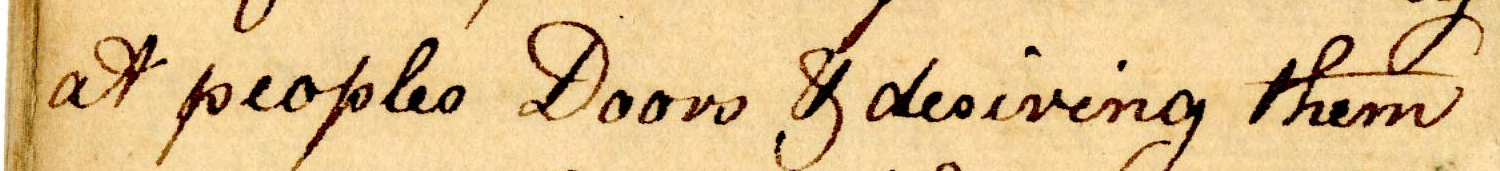at peoples Doors & desiring them
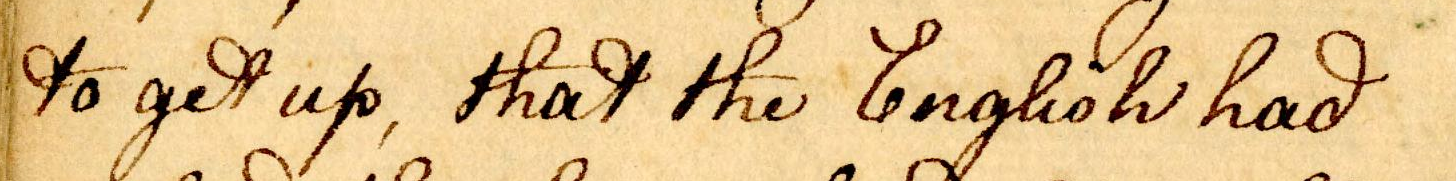to get up, that the English had
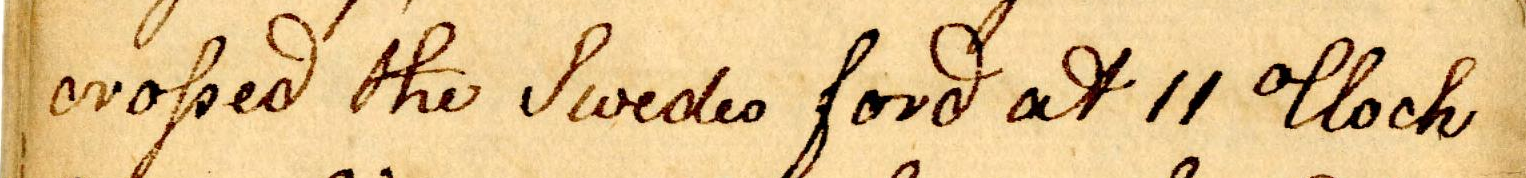crossed the Swedes ford at 11 ^oClock
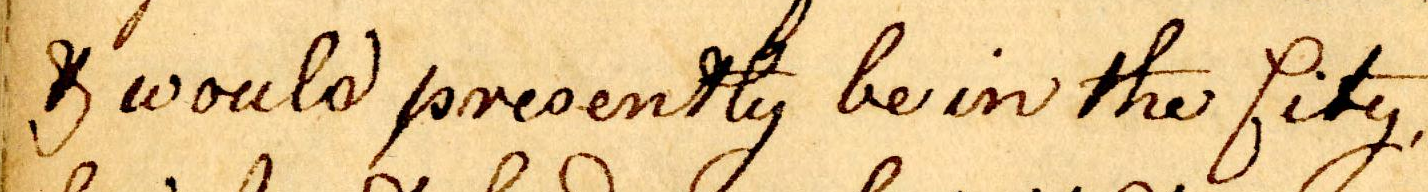& would presently be in the City,
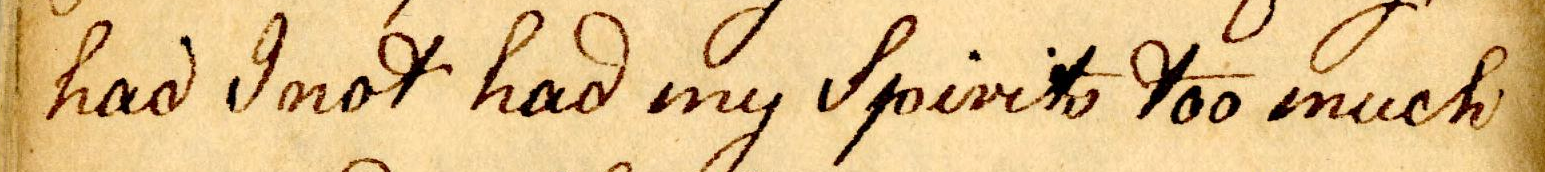had I not had my Spirits too much
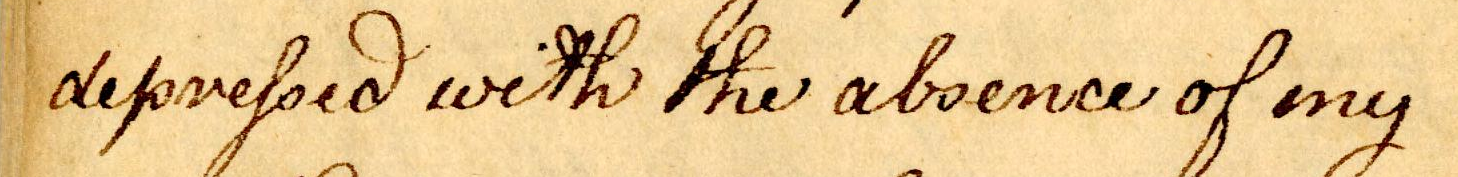depressed with the absence of my
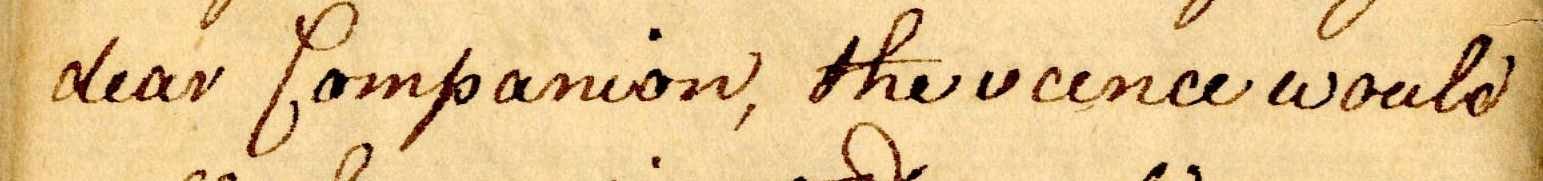dear Companion, the scence would
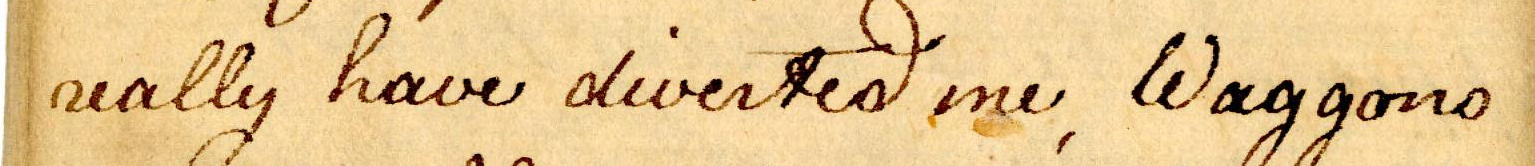really have diverted me, Waggons
